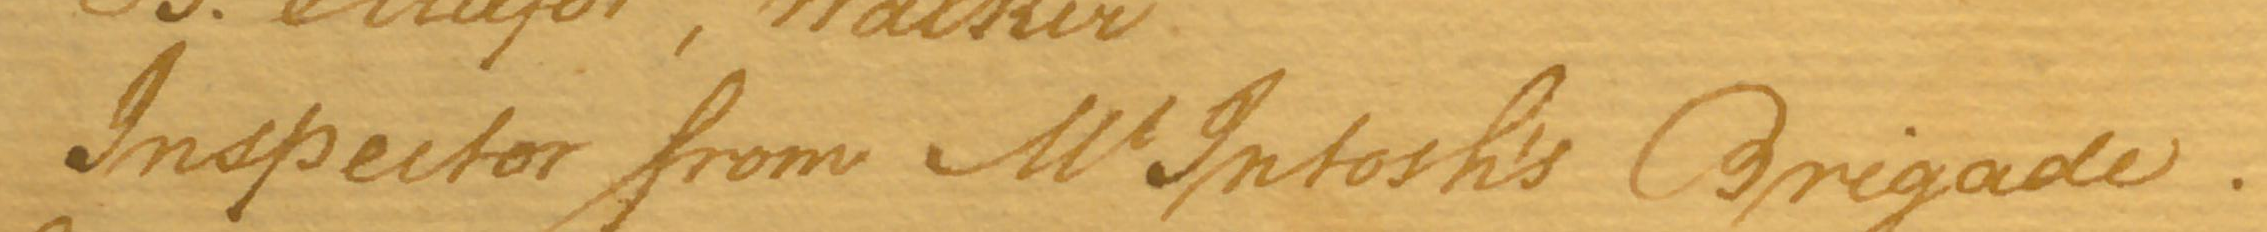Inspector from M^cIntosh's Brigade.
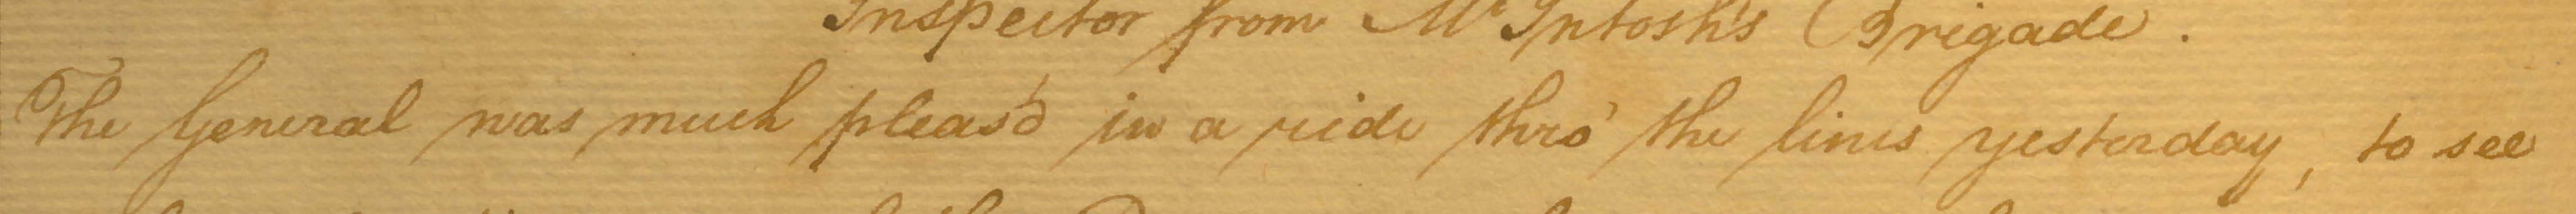The General was much pleas'd in a ride thro' the lines yesterday, to see
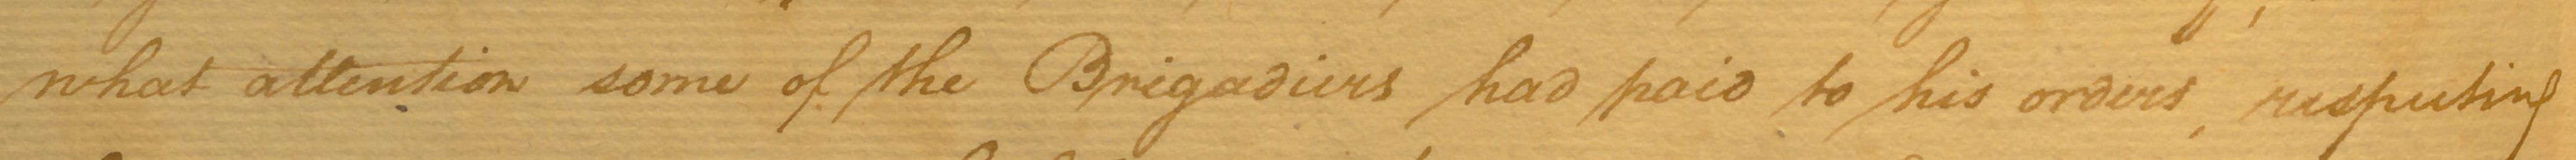what attention some of the Brigadiers had paid to his orders, respecting
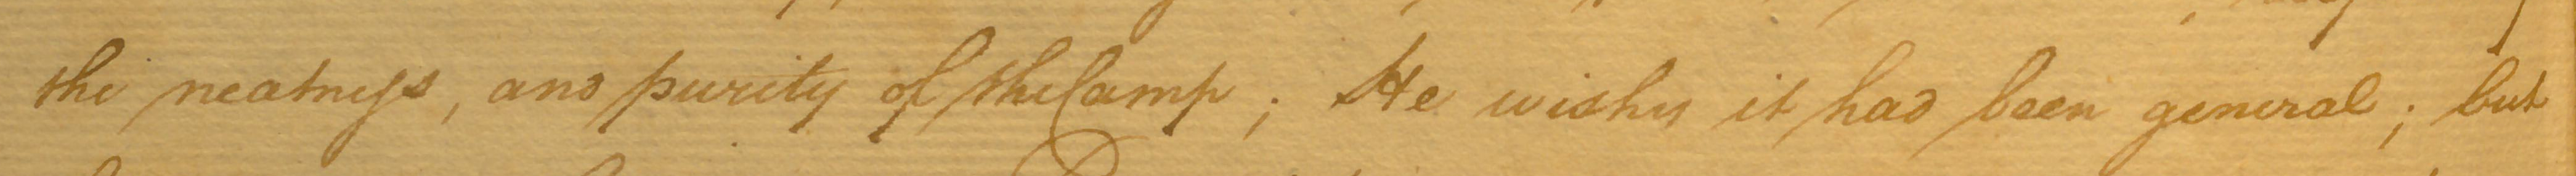the neatness, and purity of the Camp; He wishes it had been general; but
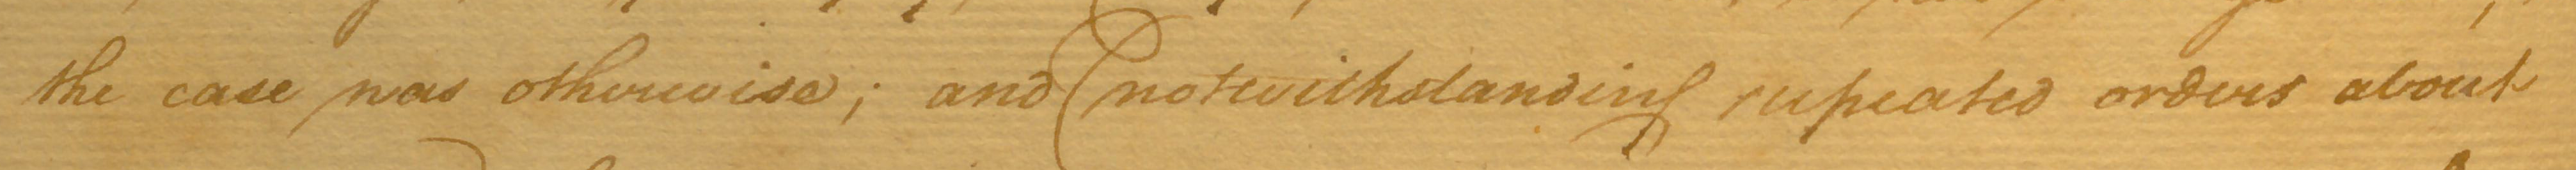the case was otherwise; and notwithstanding repeated orders about
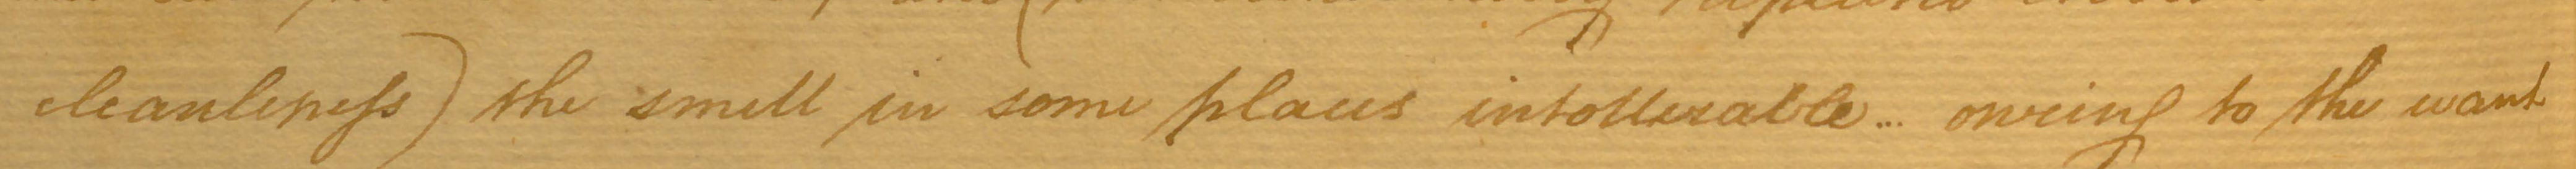cleanliness) the small in some places intollerable... oweing to the want
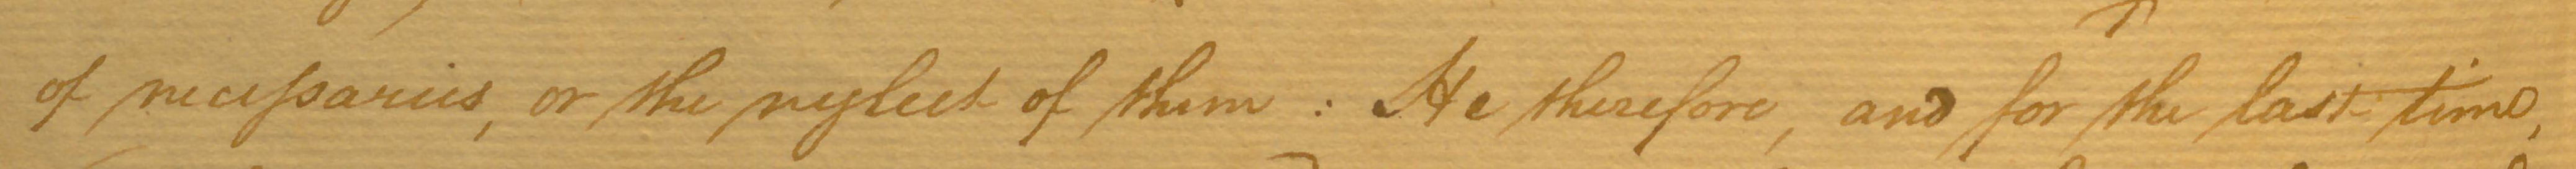of necessaries, or the neglect of them: He therefore, and for the last time,
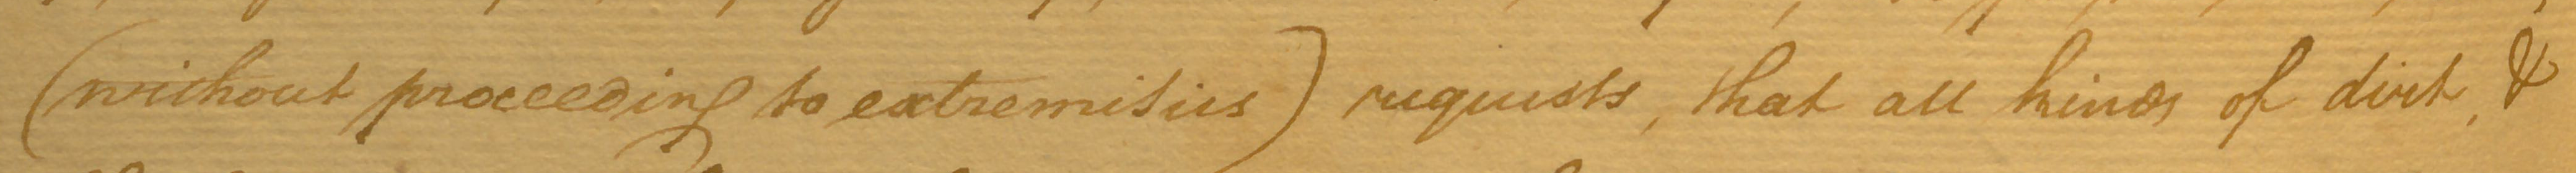(without proceeding to extremities) requests, that all kinds of dirt &
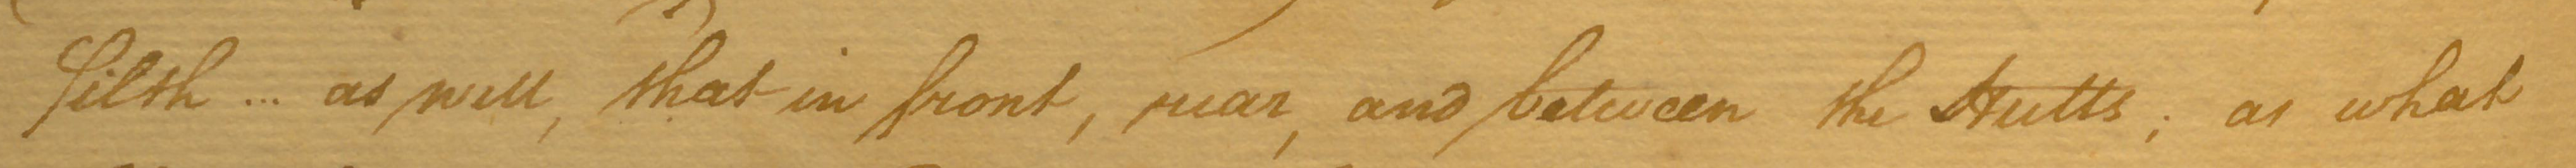filth... as well, that in front, rear, and between the Hutts; as what
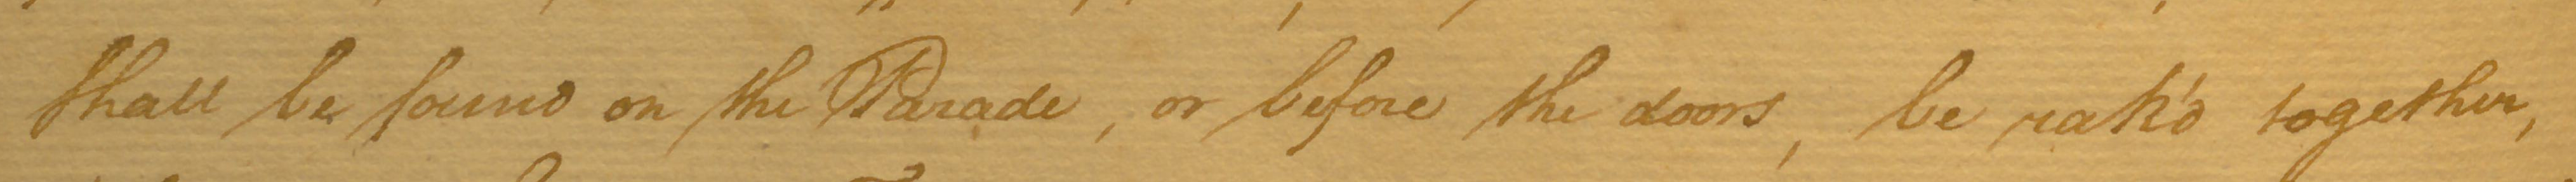shall be found on the Parade, or before the doors, be rak'd together,
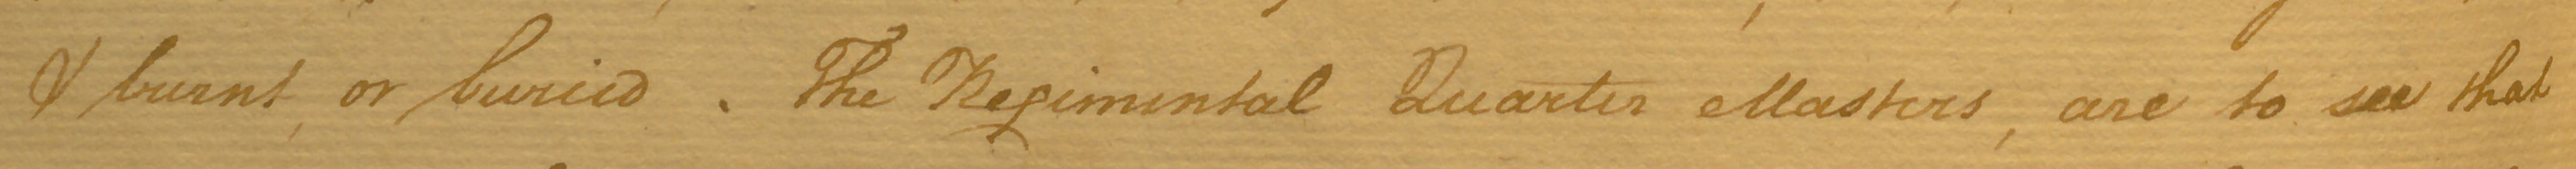& burnt or buried. The Regimental Quarter Masters, are to see that
